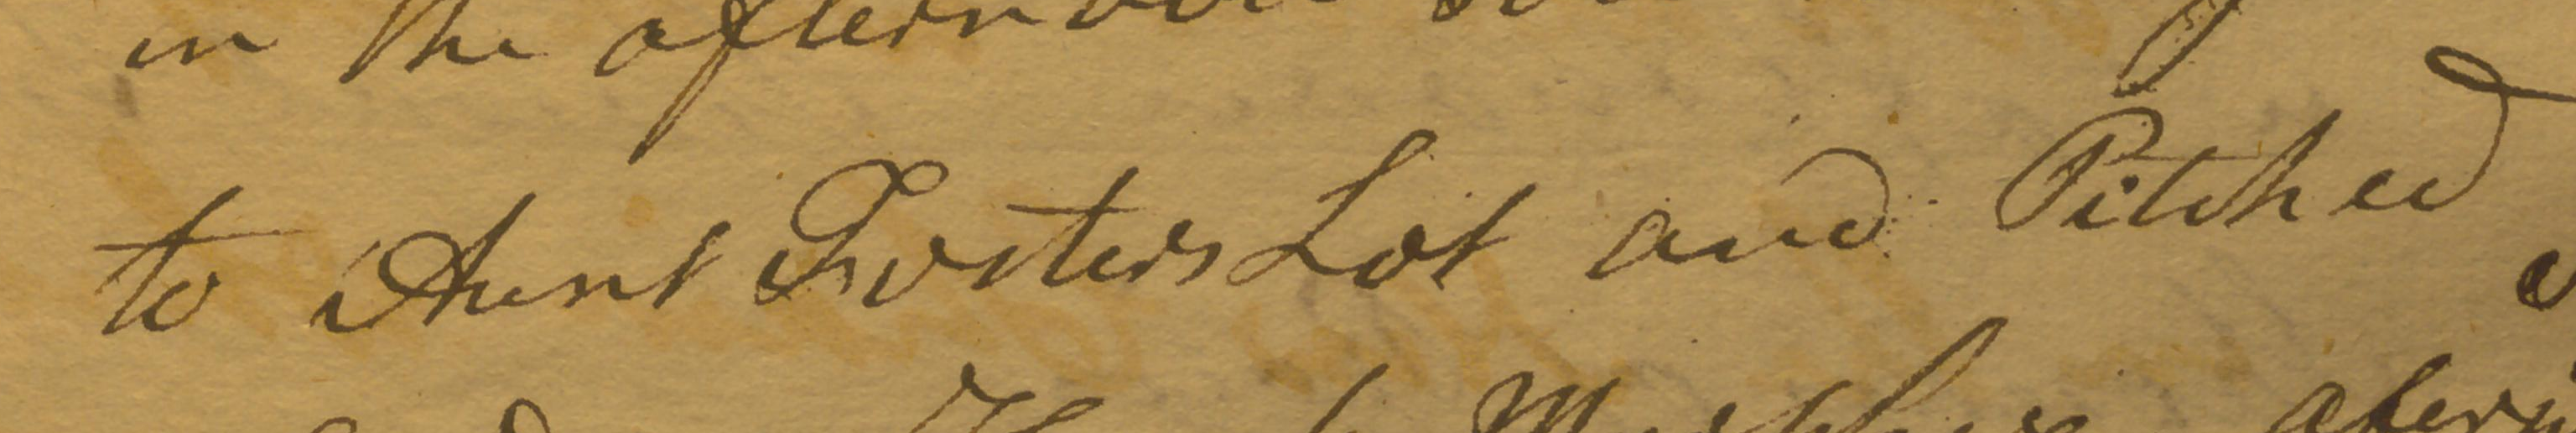to Aunt Fosters Lot and Pitched
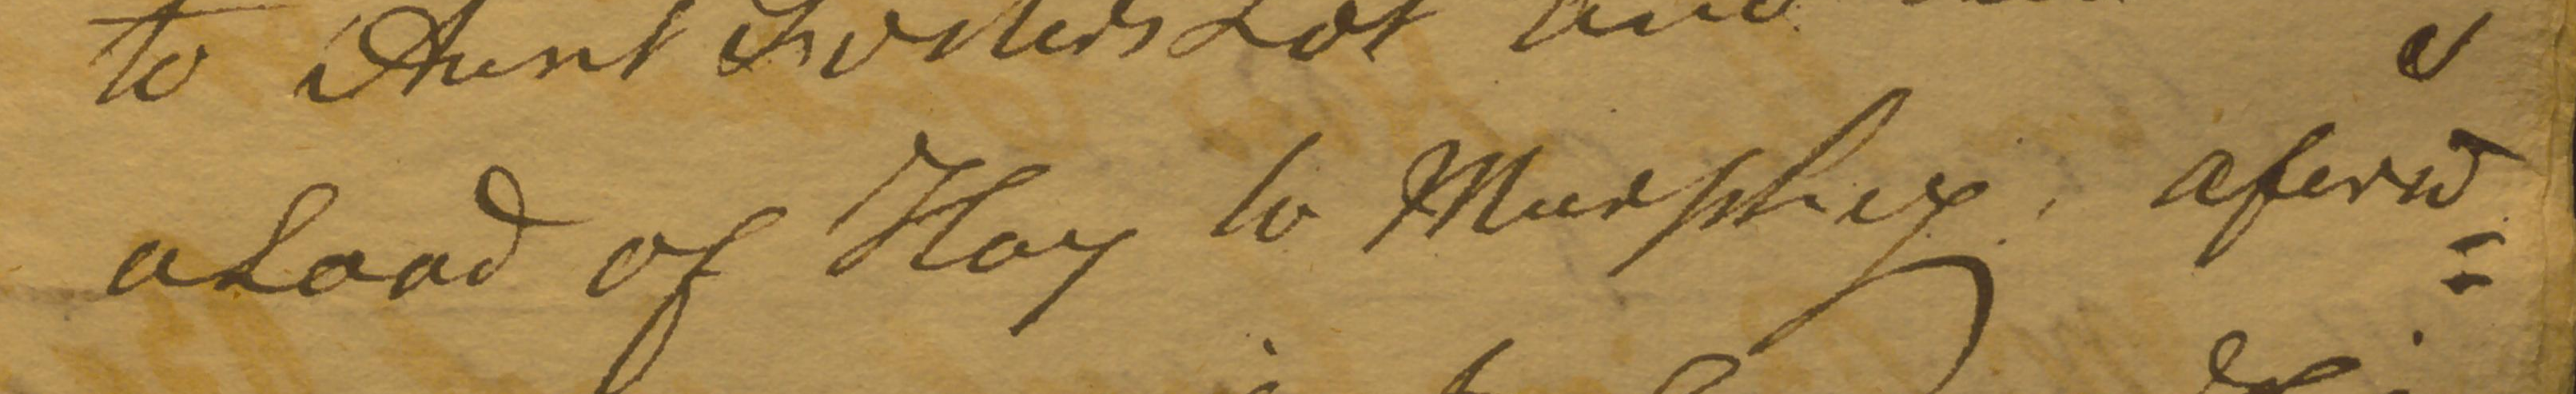a Load of Hay to Muphey, aferw
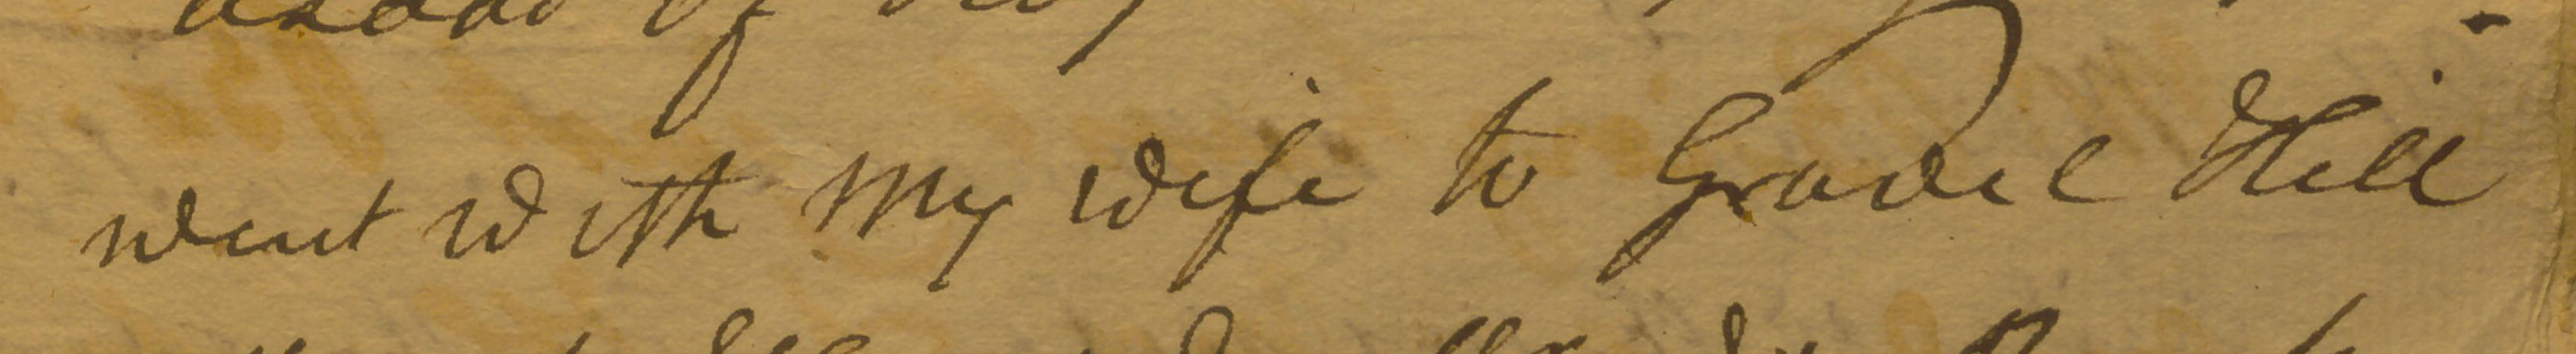went with My wife to Gravel Hill
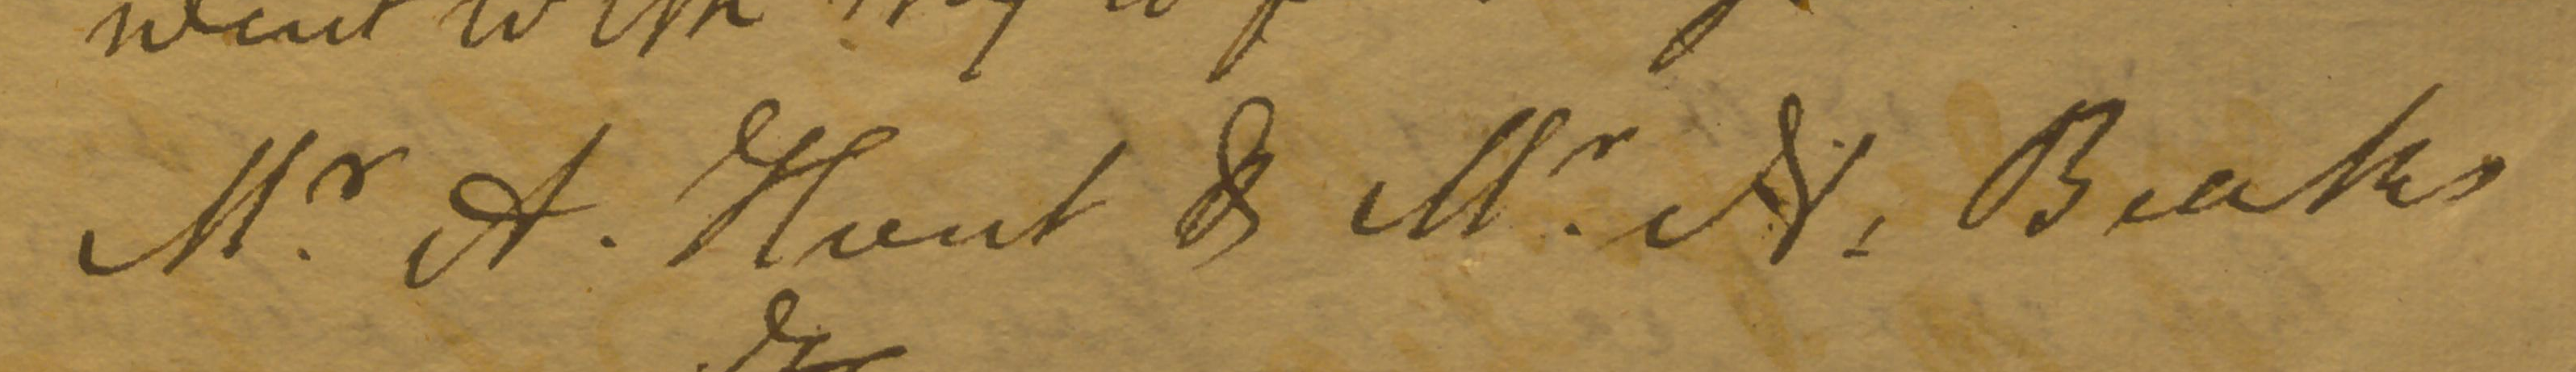M^r. A. Hunt & M^r. N. Beaks
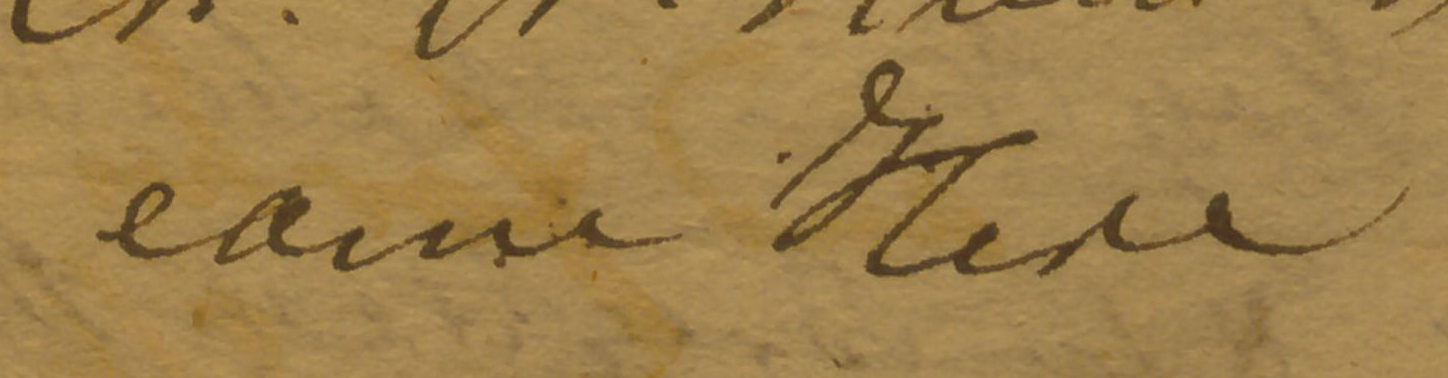came Here
